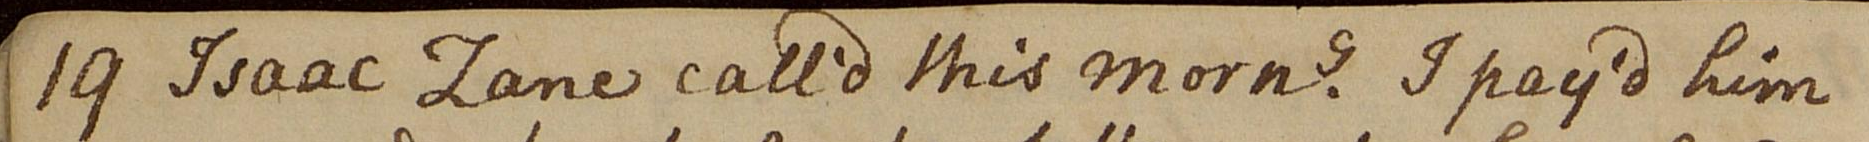19 Isaac Zane call'd this morn^g. I pay'd him
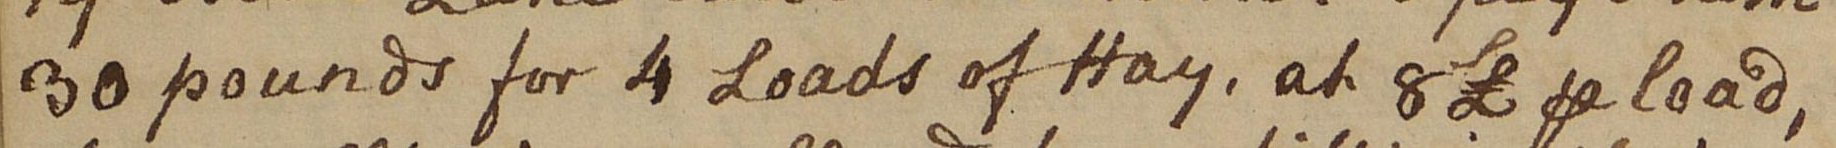30 pounds for 4 Loads of Hay. at 8£ per load,
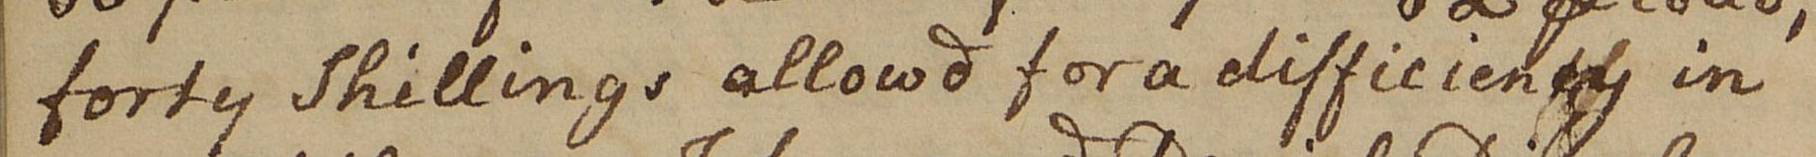forty Shillings allowd for a difficiency in
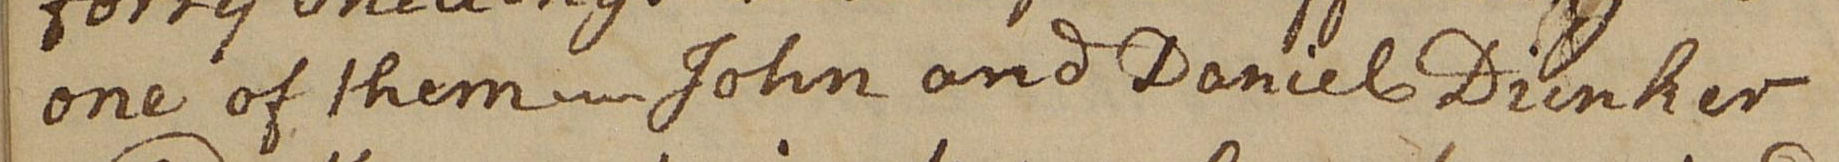one of them- John and Daniel Drinker
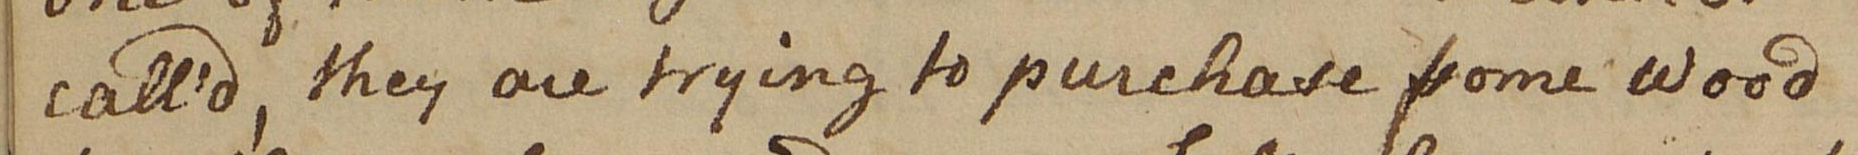call'd, they are trying to purchase some wood
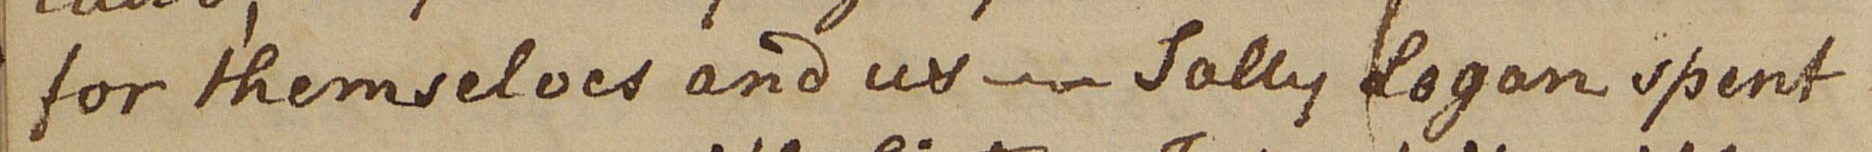for themselves and us- Sally Logan spent
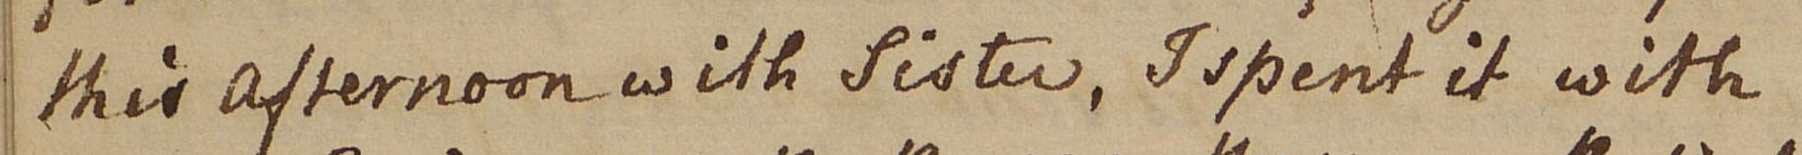this Afternoon with Sister, I spent it with
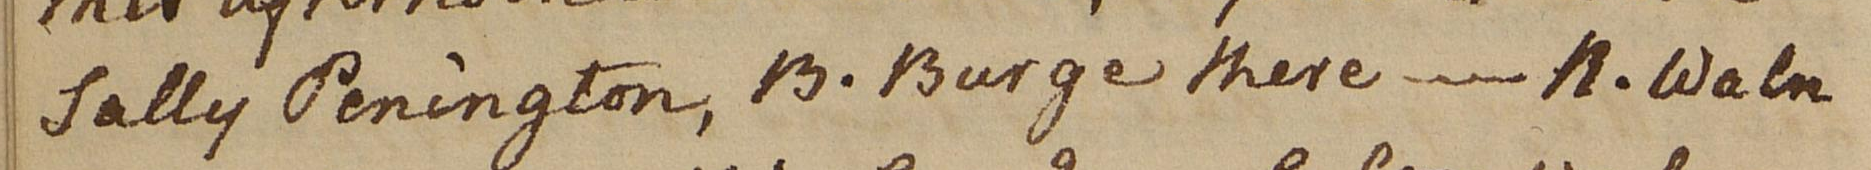Sally Penington, B. Burge there- R. Waln
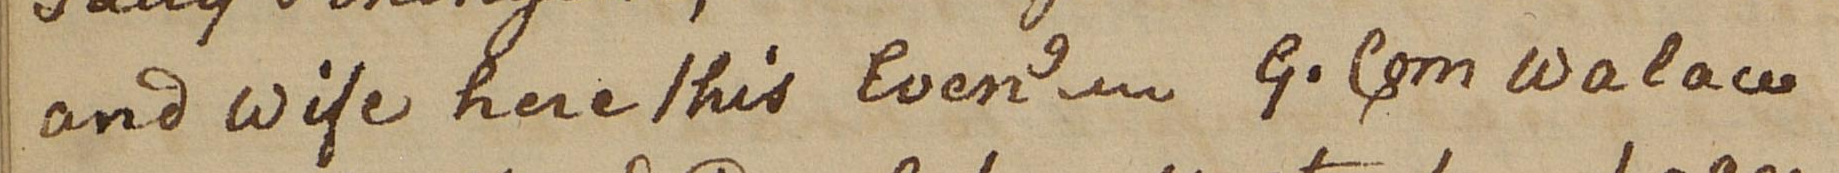and Wife here this Even^g- G. Corn Walace
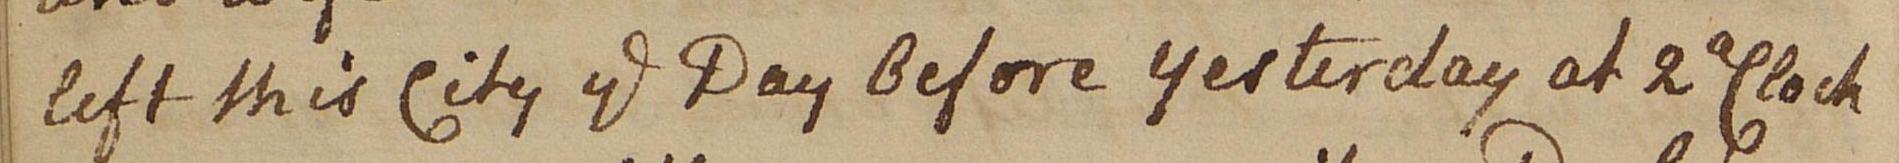left this City y^e Day before yesterday at 2 oClock
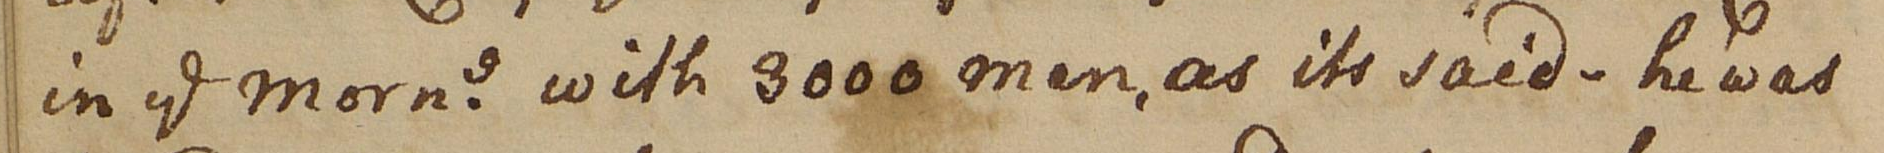in y^e morn^g. with 3000 men, as its said- he was
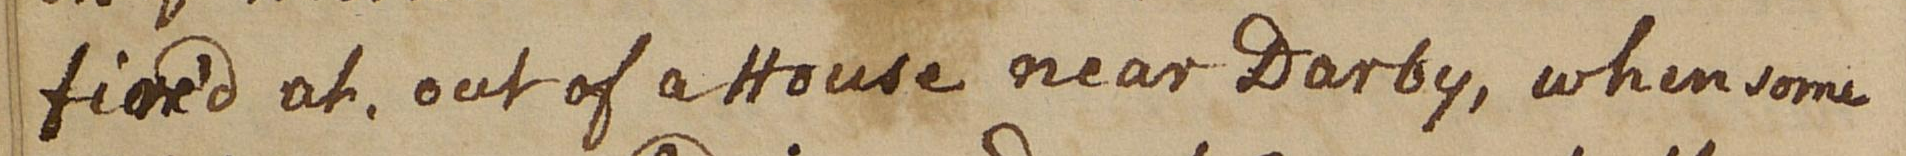fire'd at, out of a House near Darby, when some
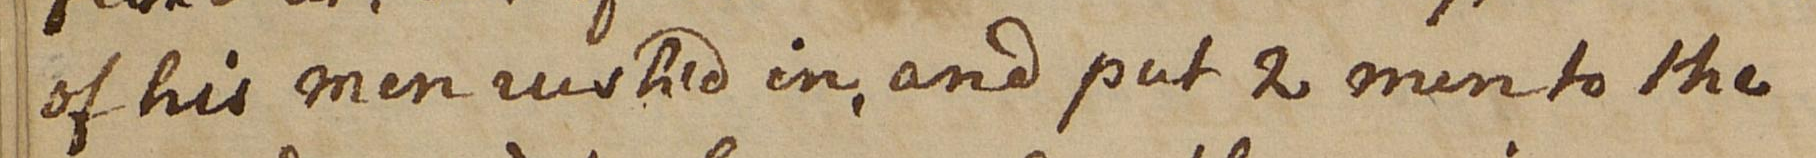of his men rush'd in, and put 2 men to the
